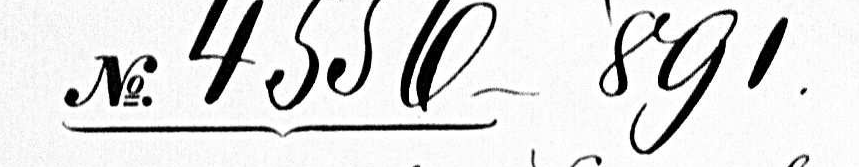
No. 4556 - 1891
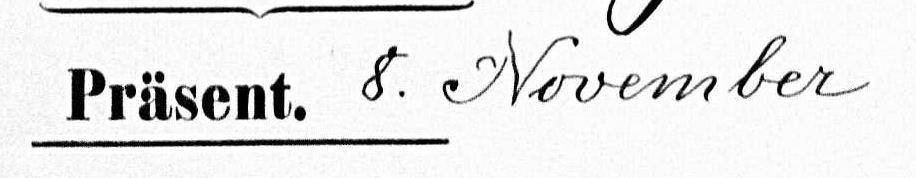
Präsent. 8. November
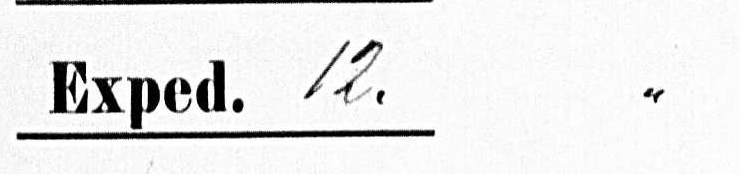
Exped. 12. „
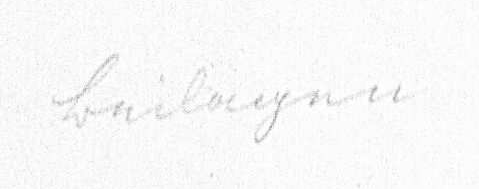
Beilagen
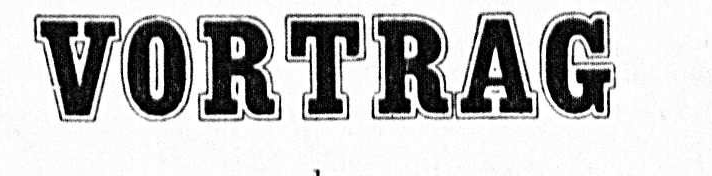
Vortrag
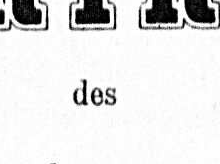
des
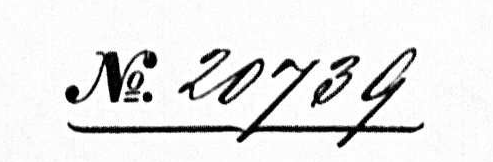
No. 20739
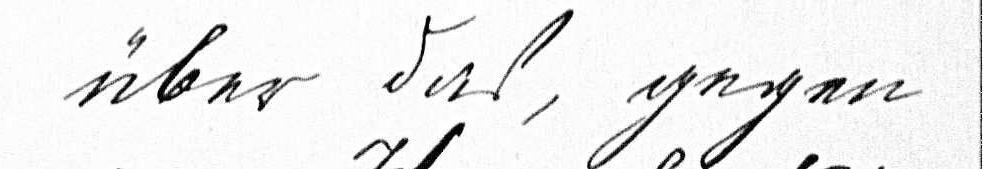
über das, gegen
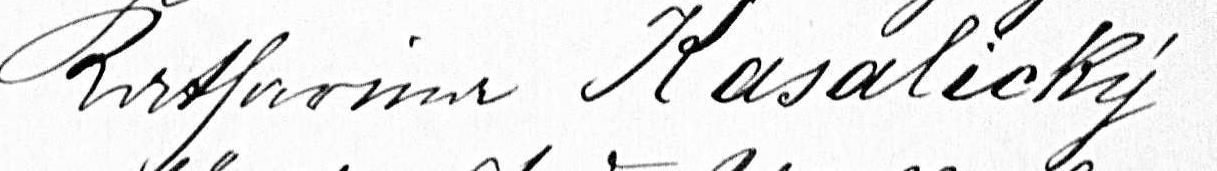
Katharina Kasalický
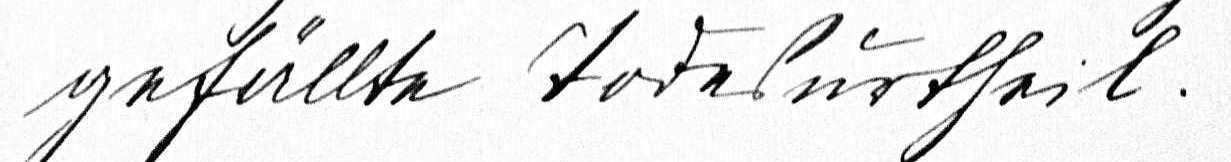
gefällte Todesurtheil.
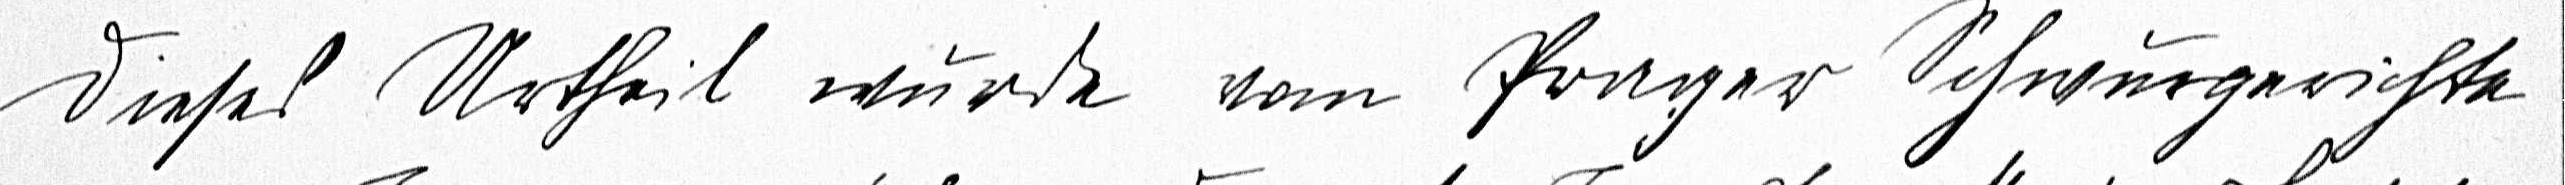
Dieses Urtheil wurde vom Prager Schwurgerichte
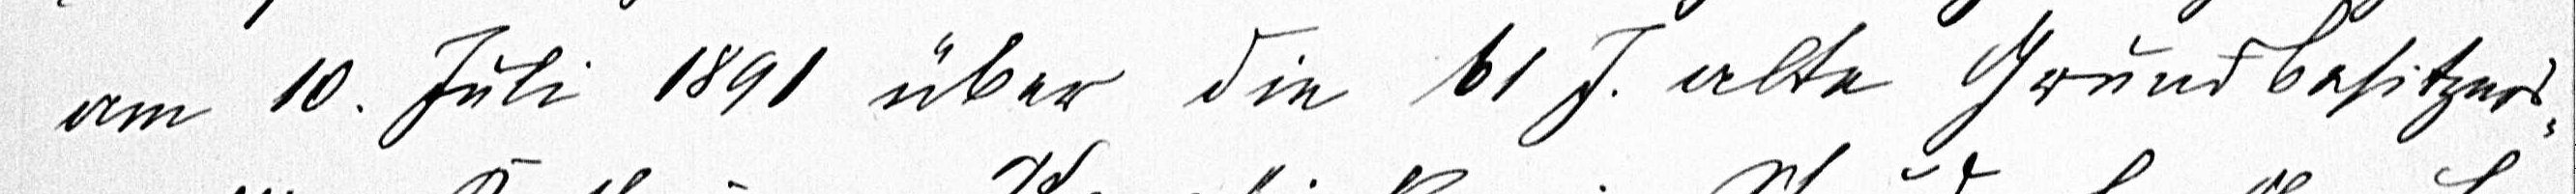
am 10. Juli 1891 über die 61 J. alte Grundbesitzer¬
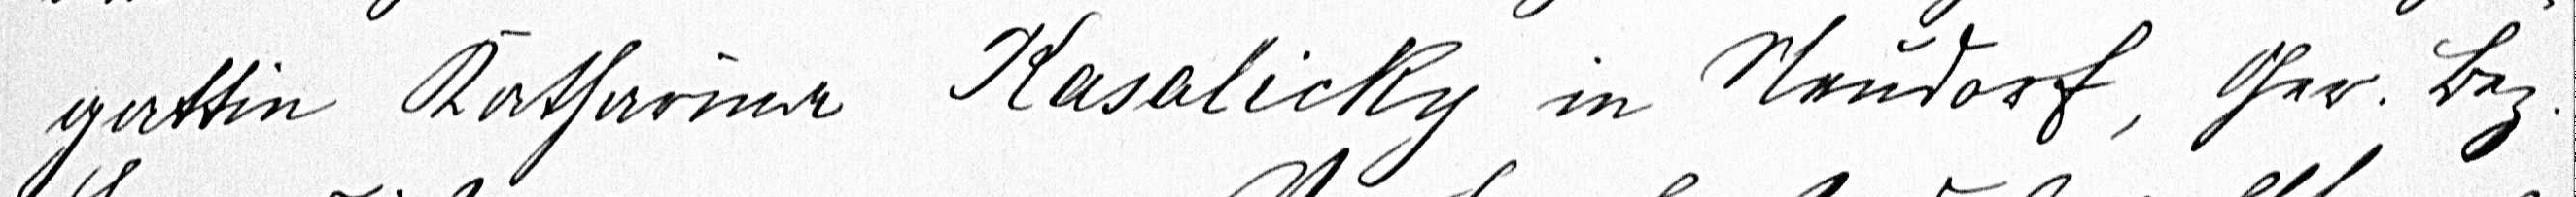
sgattin Katharina Kasalicky in Neudorf, Ger. Bez.
